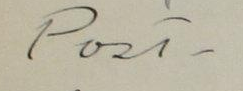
Post-
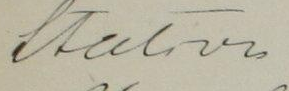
Station
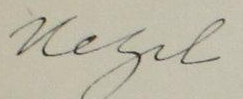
Kegel
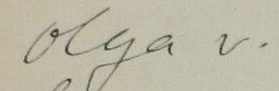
Olga v
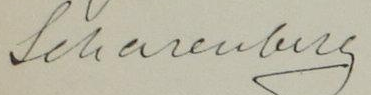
Scharenberg
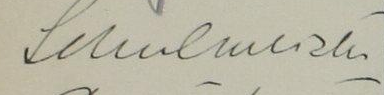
Schulmeister
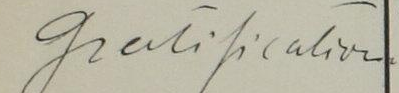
Gratification
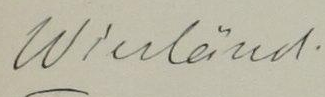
Wierländ.
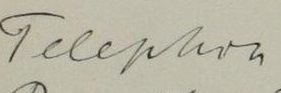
Telephon
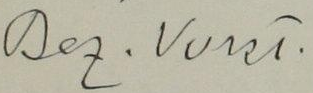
Bez. Vorst
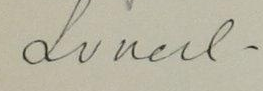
Lokal
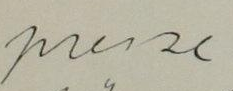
preise
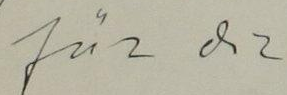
für die
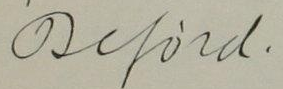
Beförd.
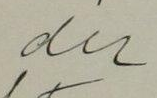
der
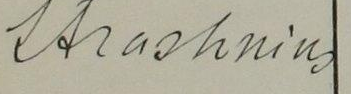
Strashniks
